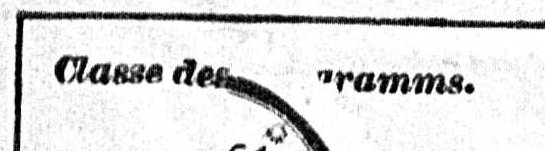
Classe des Telegramms.
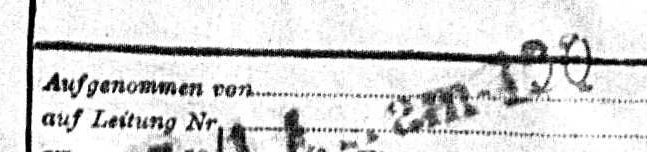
Aufgenommen von ...
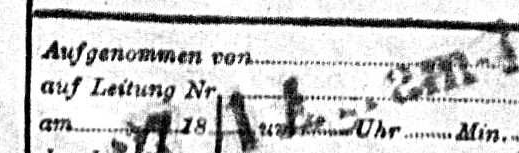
auf Leitung Nr. ...
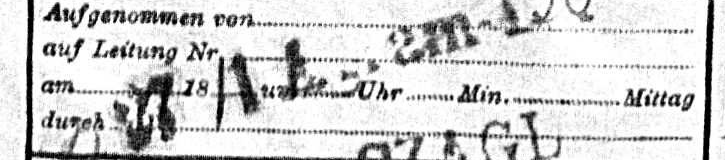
am ... 18 ... um ... Uhr ... Min. ... Mittag
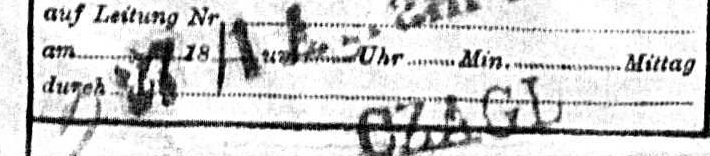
durch
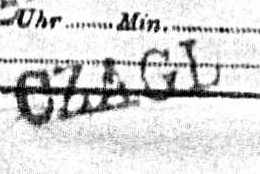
OZAGL
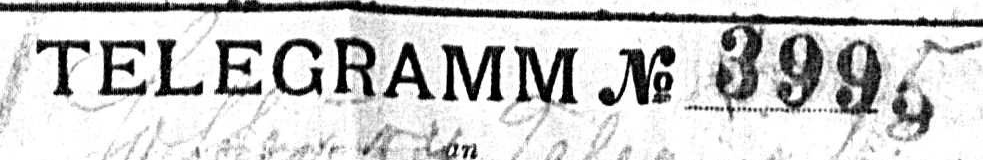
Telegramm No 3995
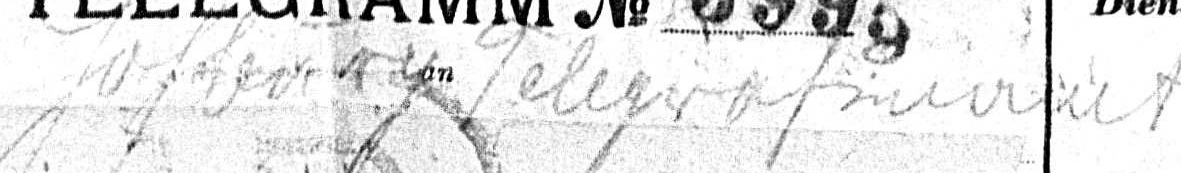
xx an Telegrafenamt
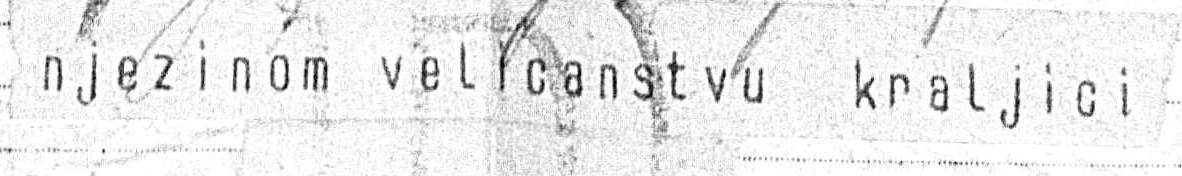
njezinom velicanstvu kraljici
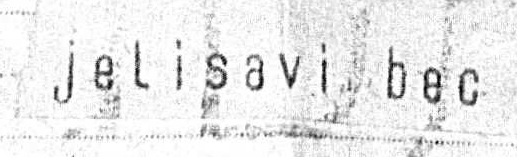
jelisavi bec
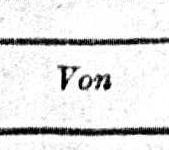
Von
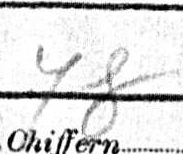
xx
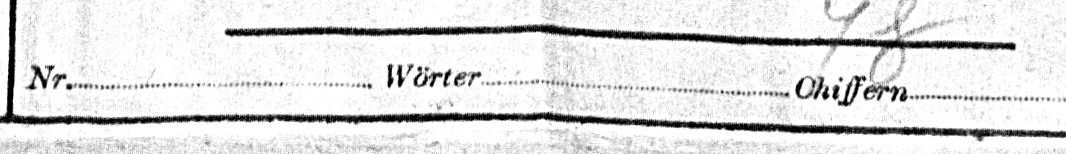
Nr.................................Wörter...............................Chiffern.................
